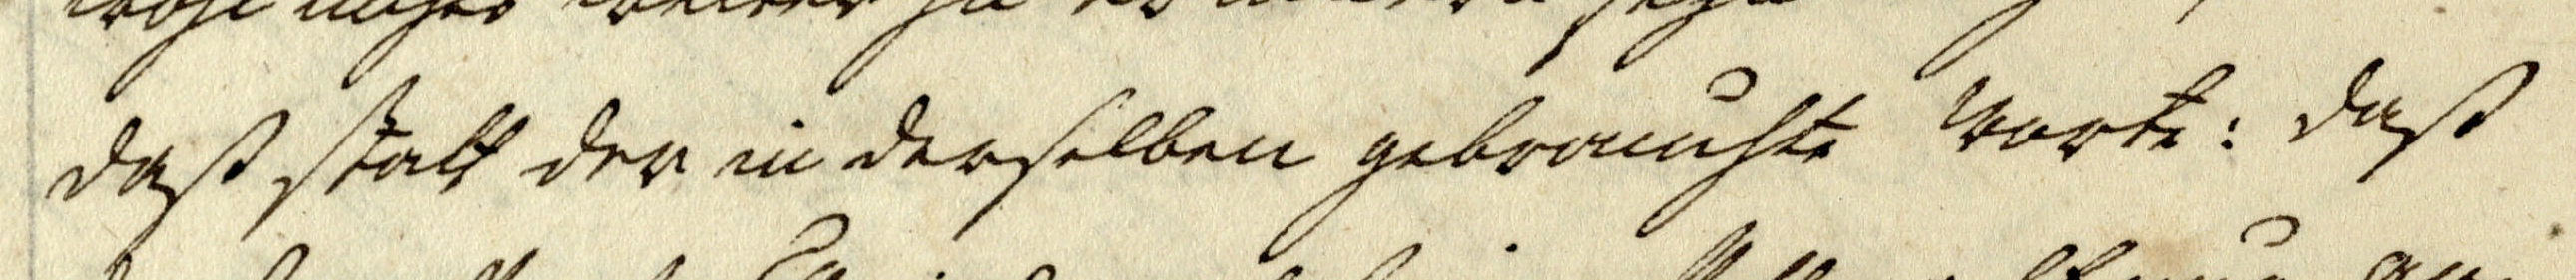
daß statt der in derselben gebrauchte Worten: daß
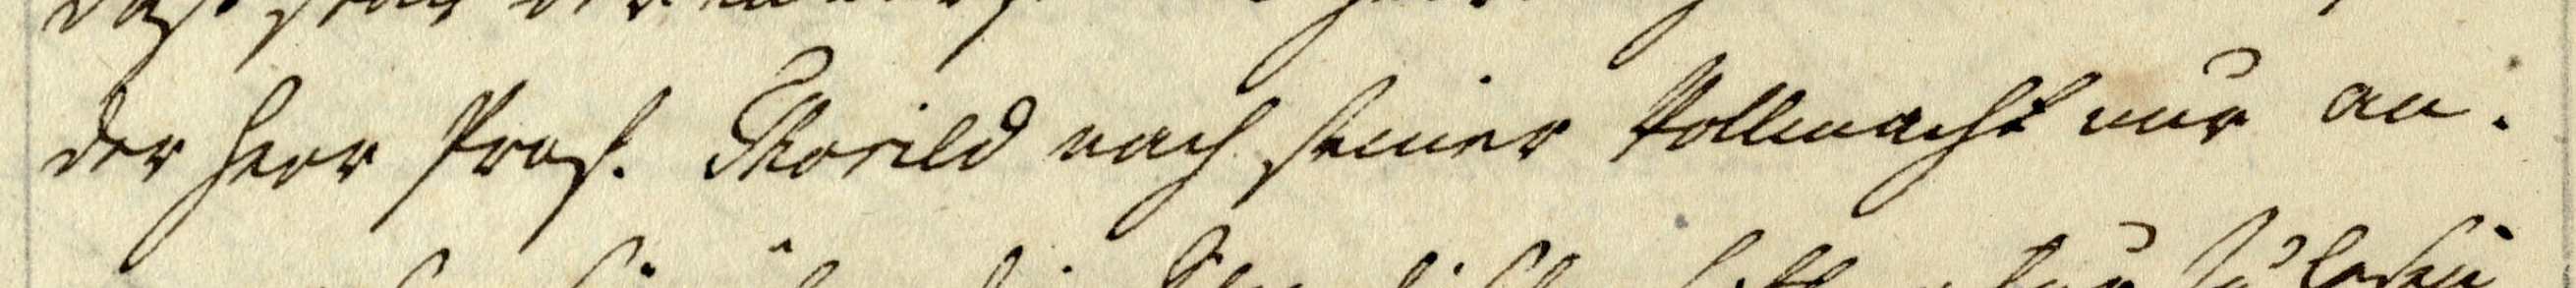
der Herr Prof. Thorild nach seiner Vollmacht nur an¬
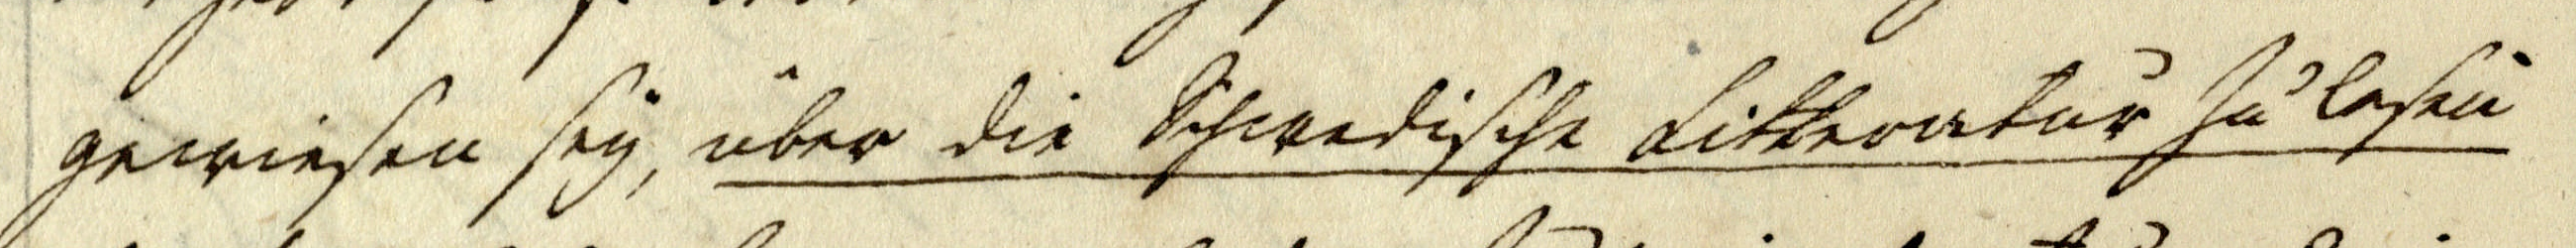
gewiesen seÿ, über die Schwedische Litteratur zu lesen
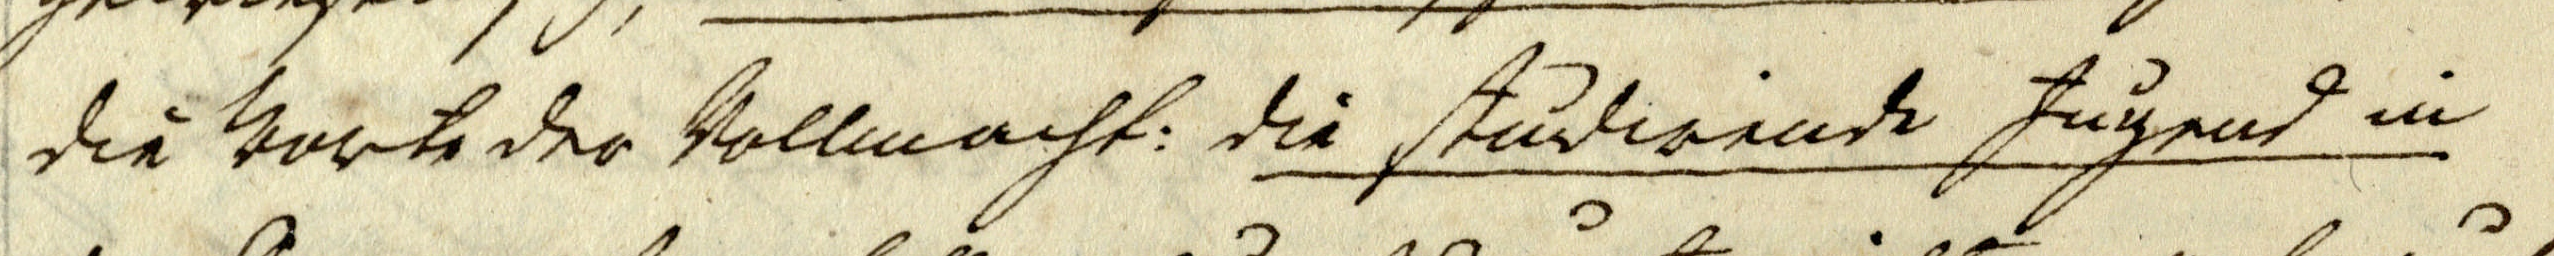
die Worte der Vollmacht: die studirende Jugend in
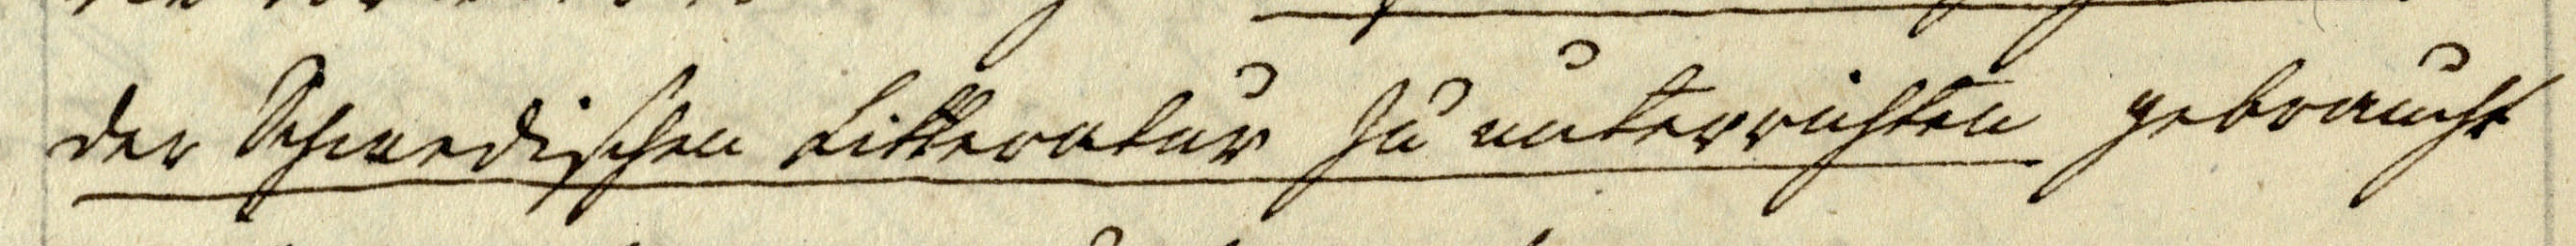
der Schwedischen Litteratur zu unterrichten gebraucht
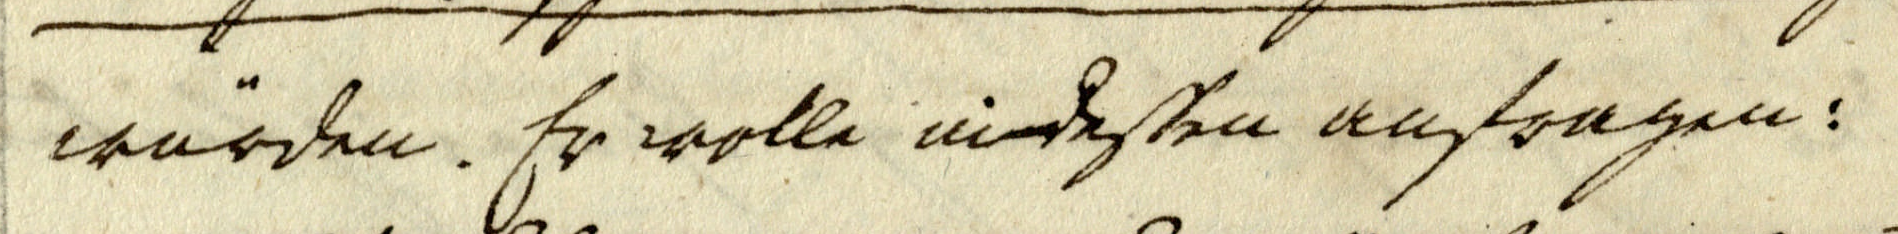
würden. Er wolle indessen anfragen:
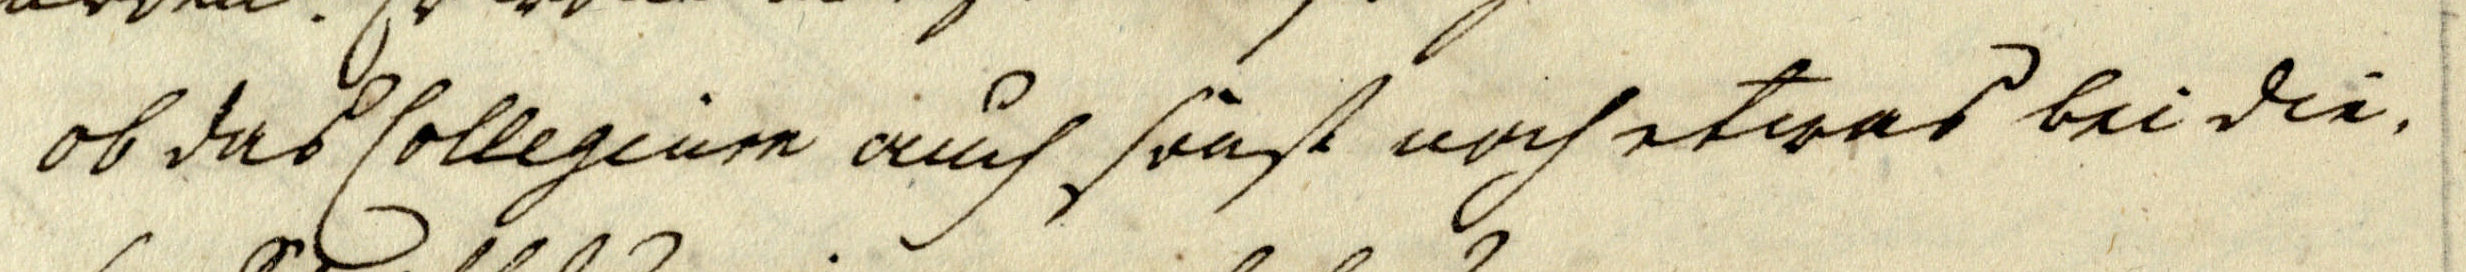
ob das Collegium auch sonst noch etwas bei die¬
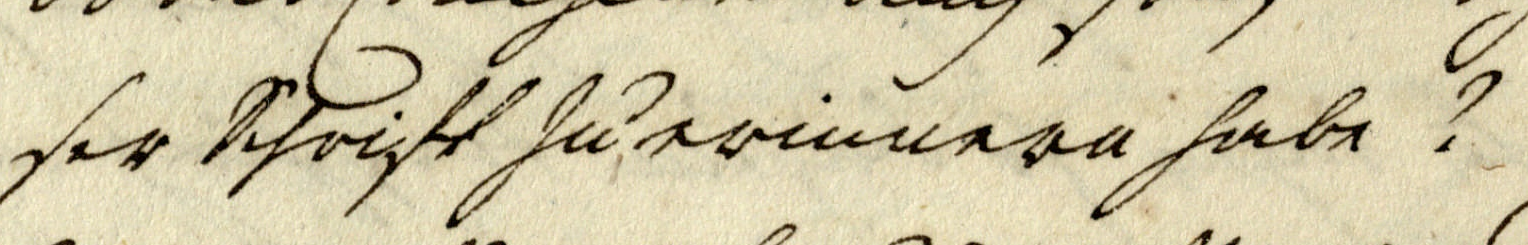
ser Schrift zu erinnern habe ?
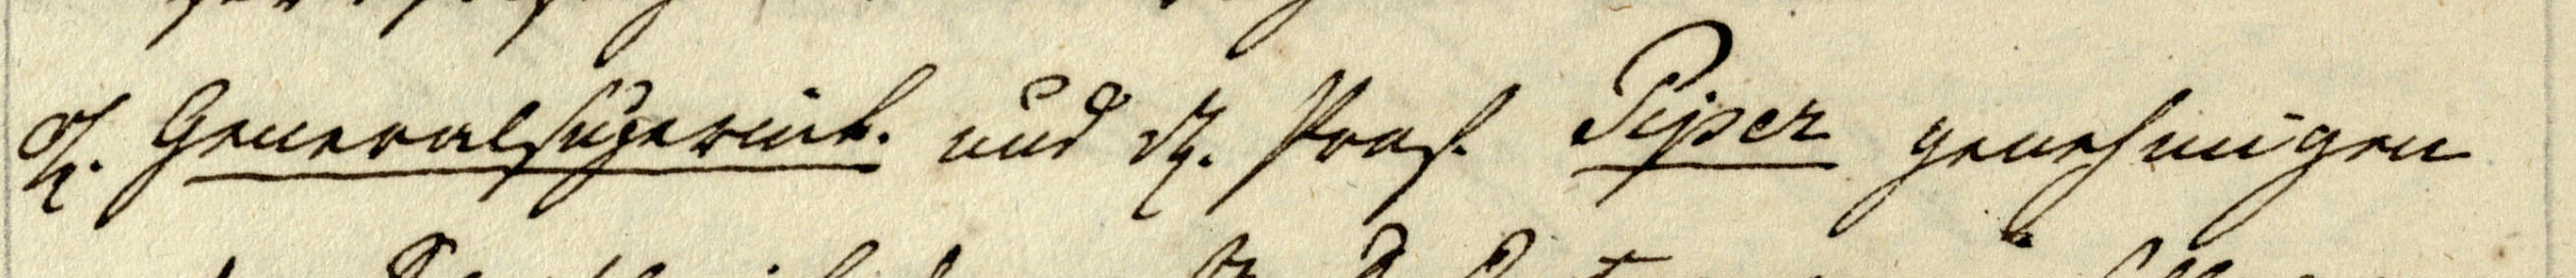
dh. Generalsuperint. und dh. Prof. Piper genehmigen
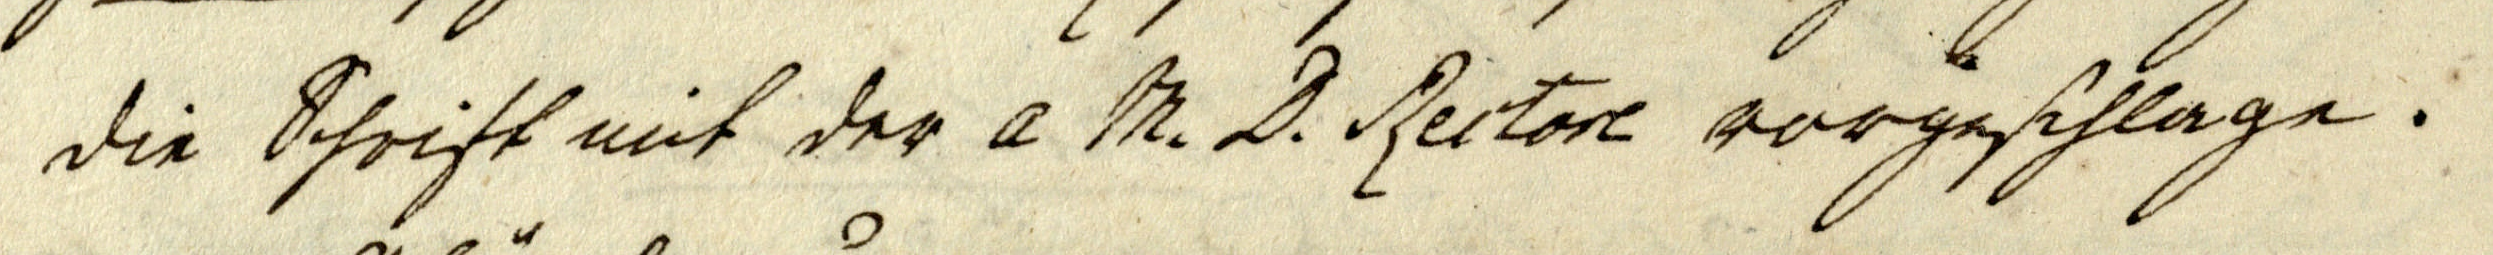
die Schrift mit der a M. D. Rector vorgeschlage¬
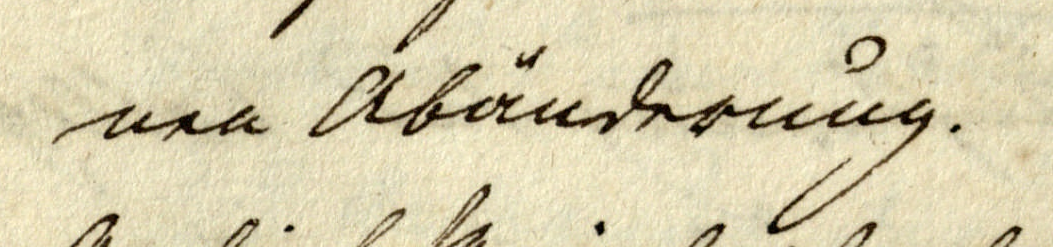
nen Abänderumg.
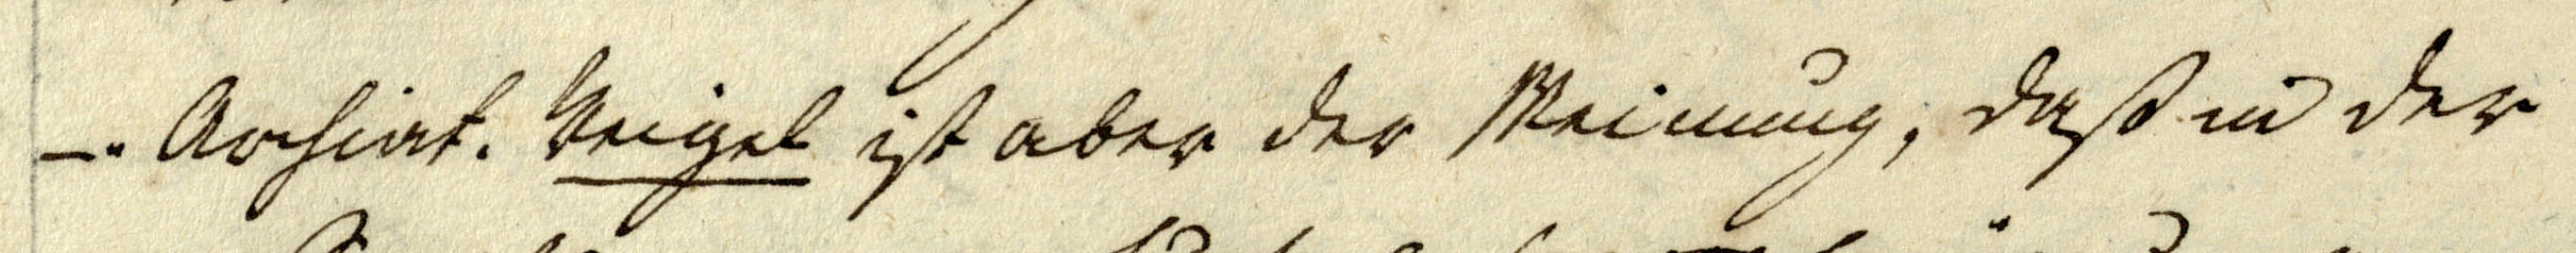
Archiat. Weigel ist aber der Meinung, daß in der
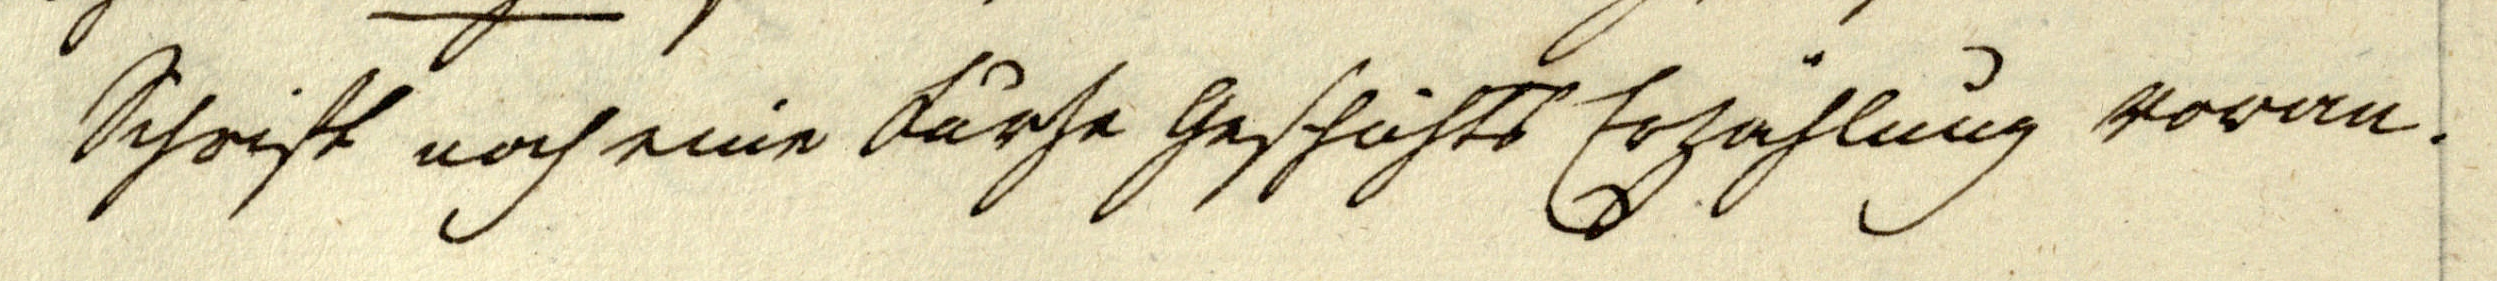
Schrift noch eine kurze Geschichts Erzählung voran¬
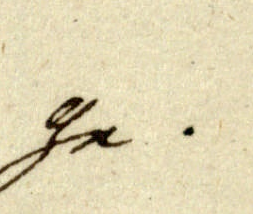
ge
